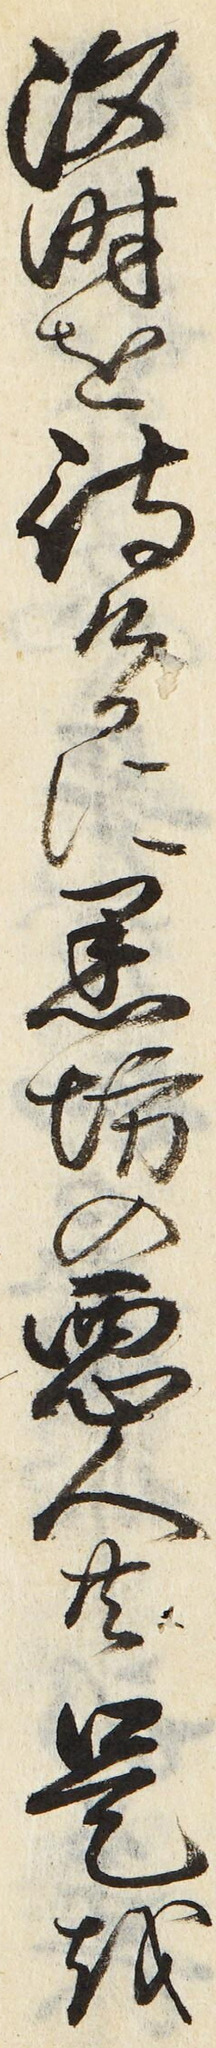汐時を待けるに黒坊の悪人共是を
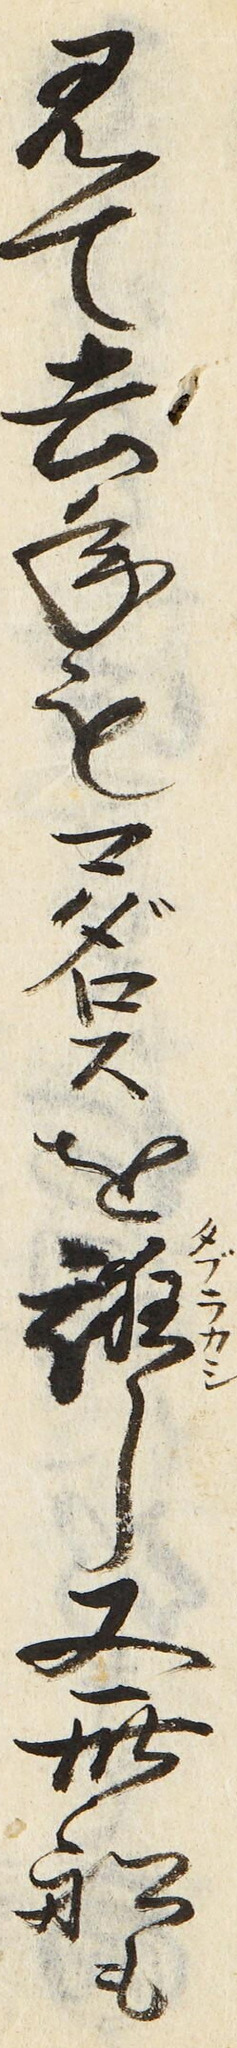見て去年もマダロスを誑し又此船も
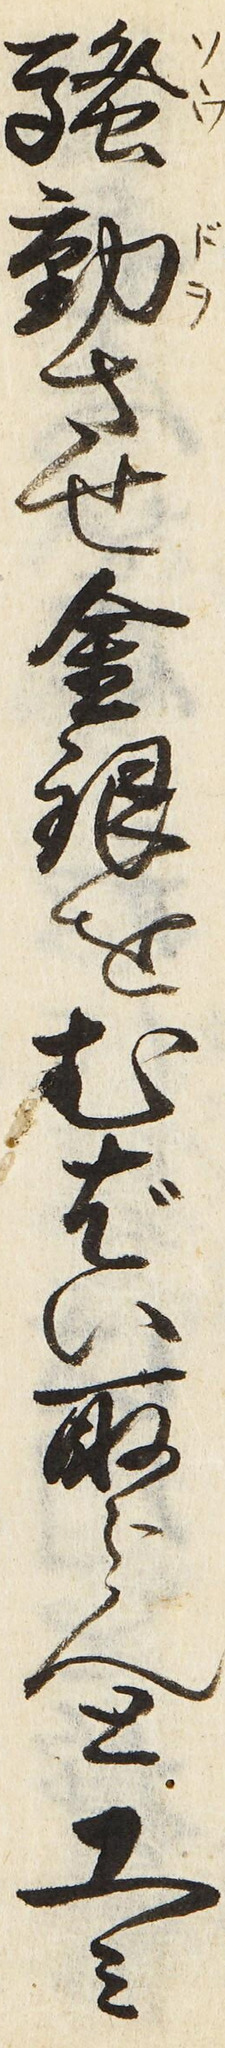騒動させ金銀をむばい取らんと工み
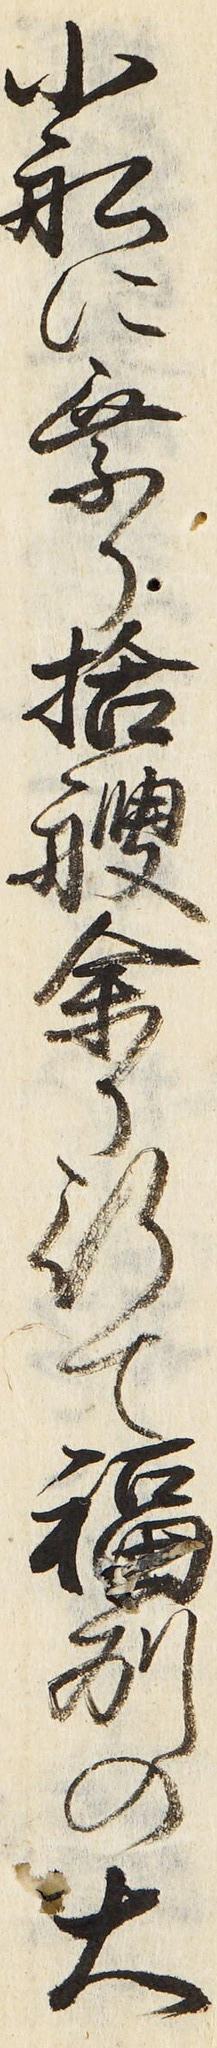小船に乗り拾艘余り行て福州の大
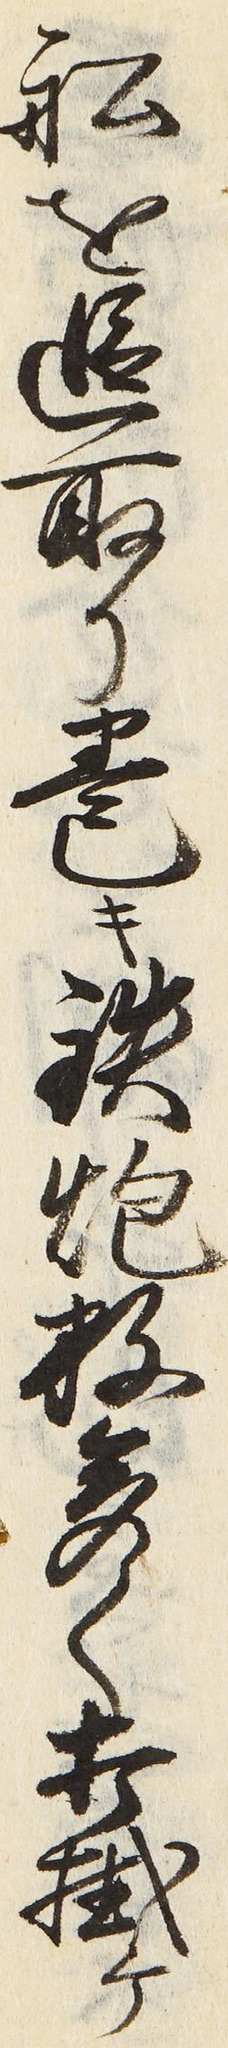船を追取り巻き鉄砲数多く打掛け
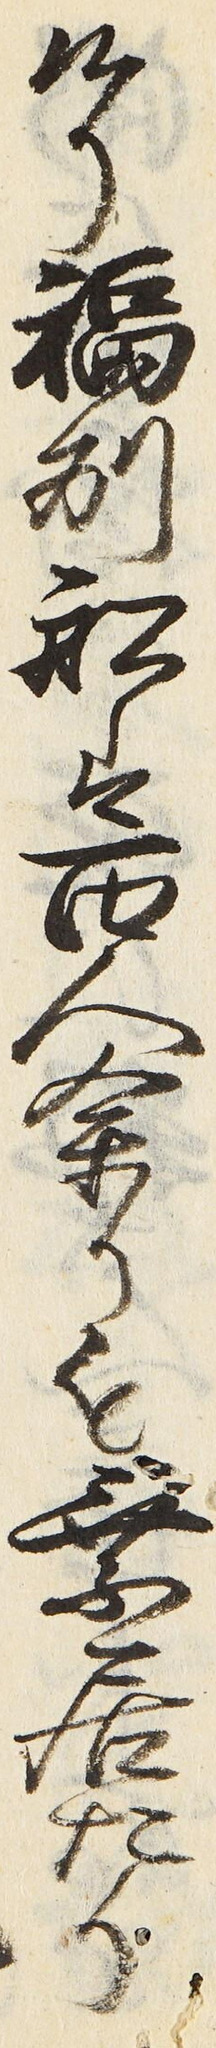けり福州船は百人余りも乗居たり
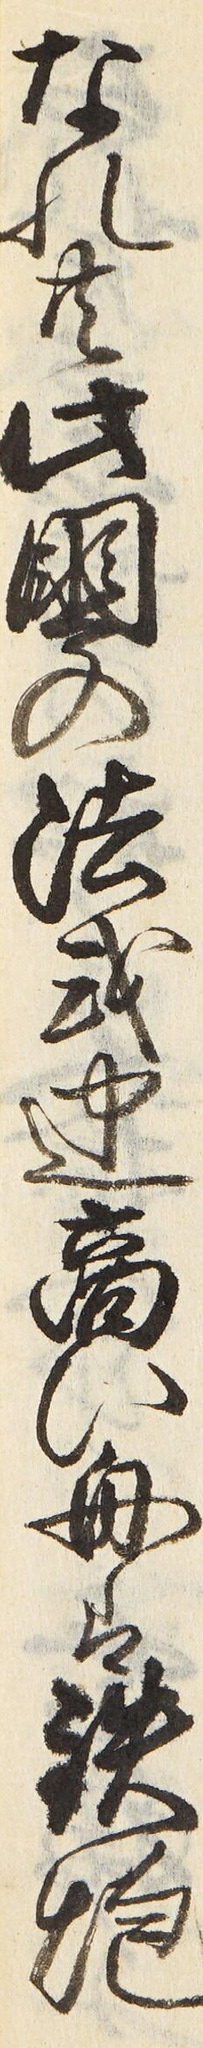なれ共此国の法式迚商ひ舟は鉄砲
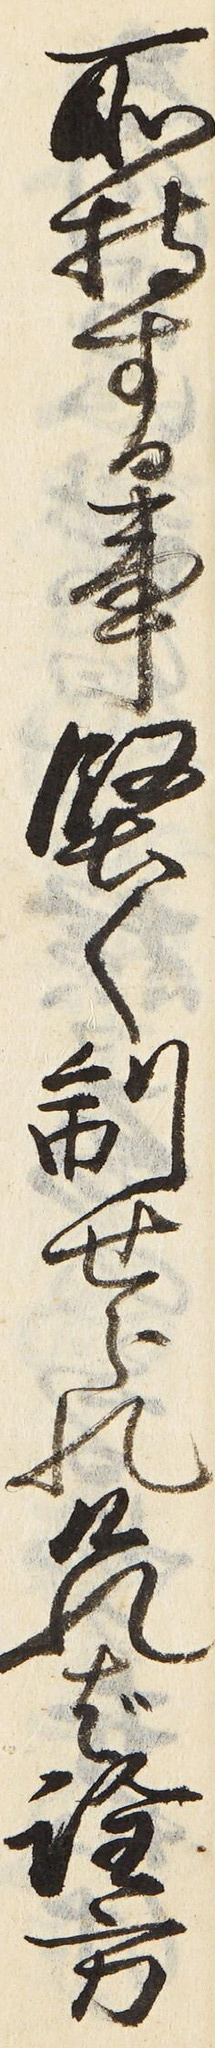所持する事堅く制せられければ詮方
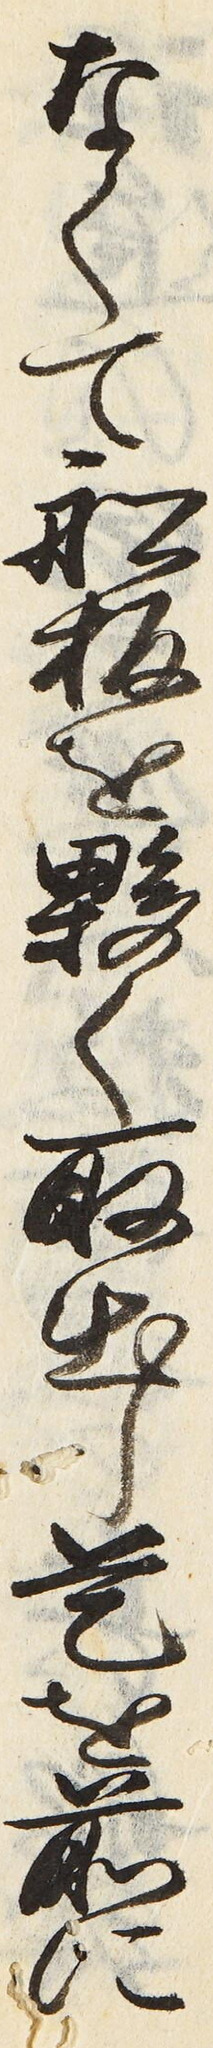なくて船板を夥く取出し是を前に
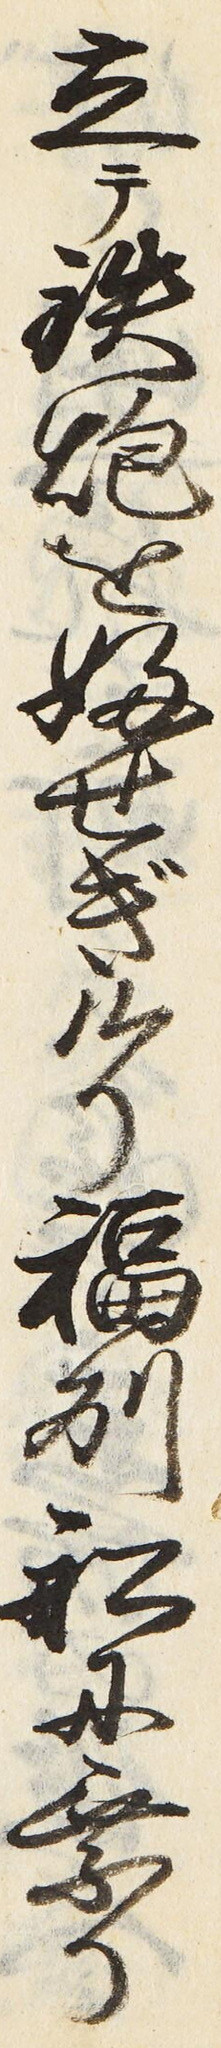立て鉄砲をふせぎけり福州船に乗り
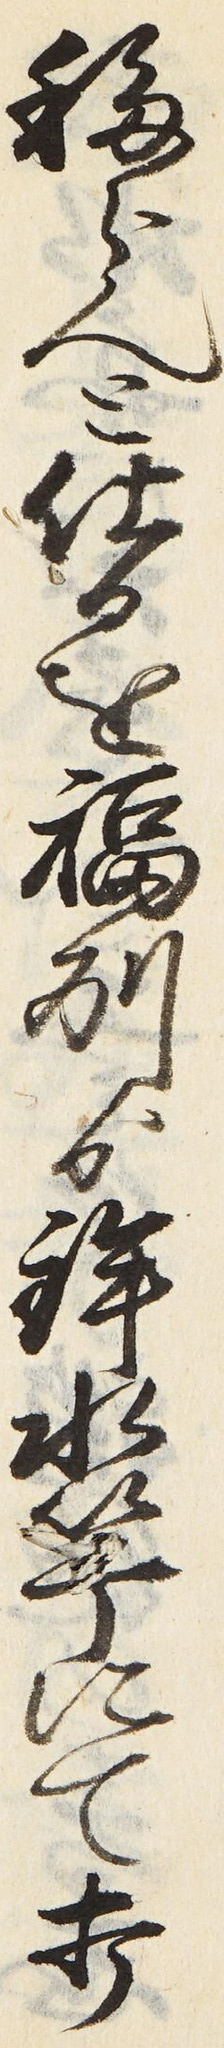移らんと仕るを福州ゟ鉾水竿にて打
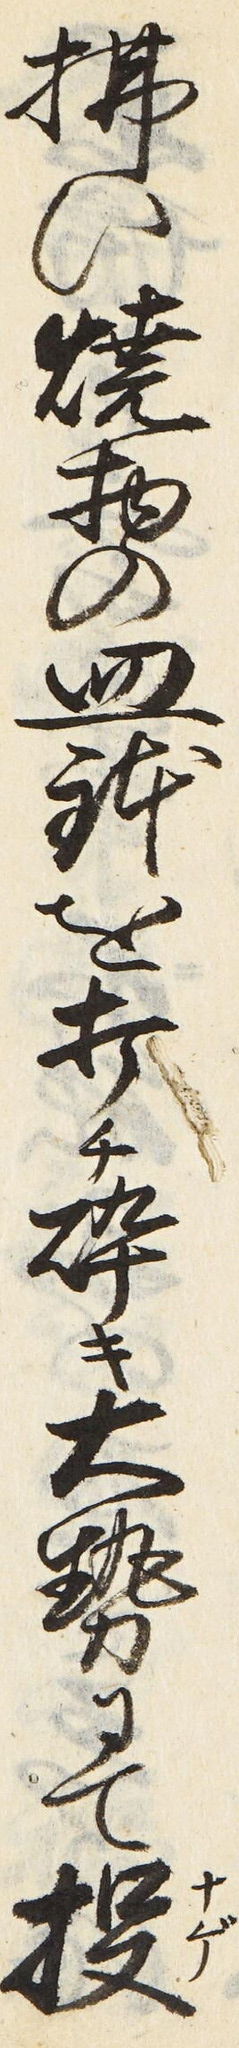払ひ焼物の皿鉢を打ち砕き大勢にて投
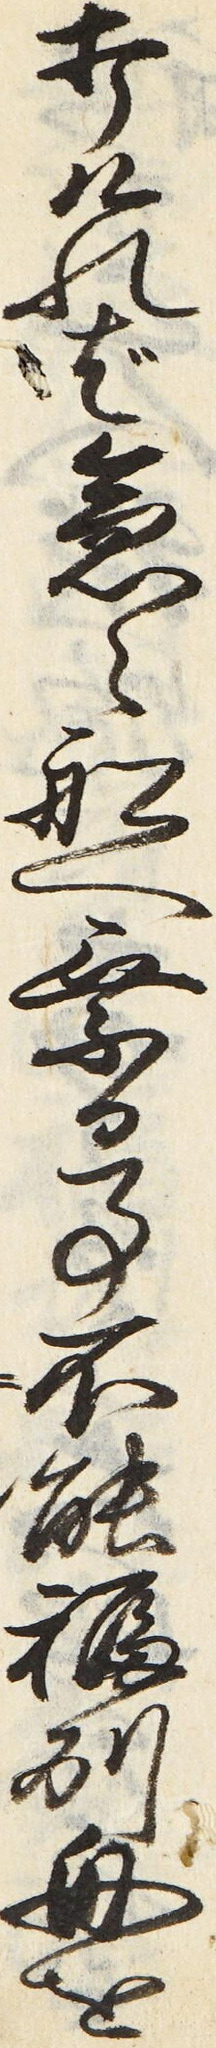打ければ急々船へ乗る事不能福州舟を
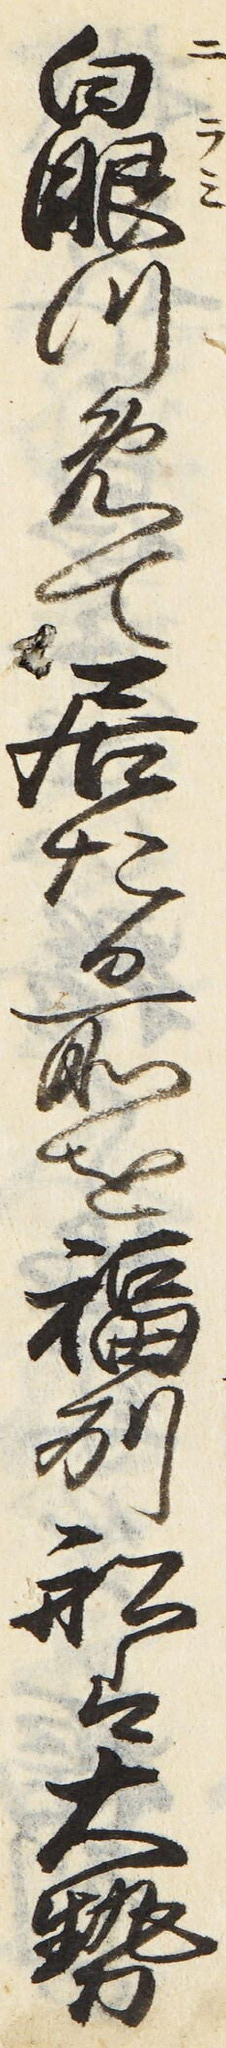白眼つめて居たる所を福州船は大勢
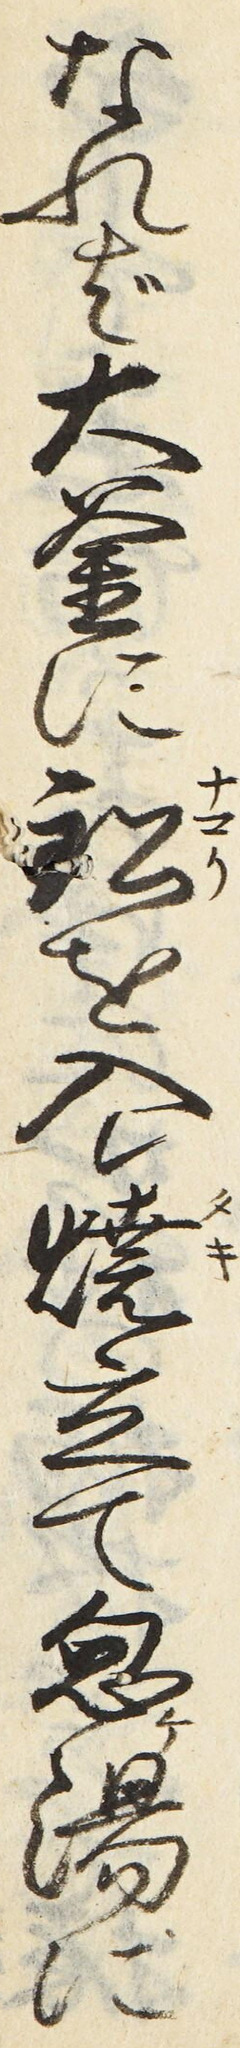なれば大釜に鉛を入れ焼立て忽ち湯に

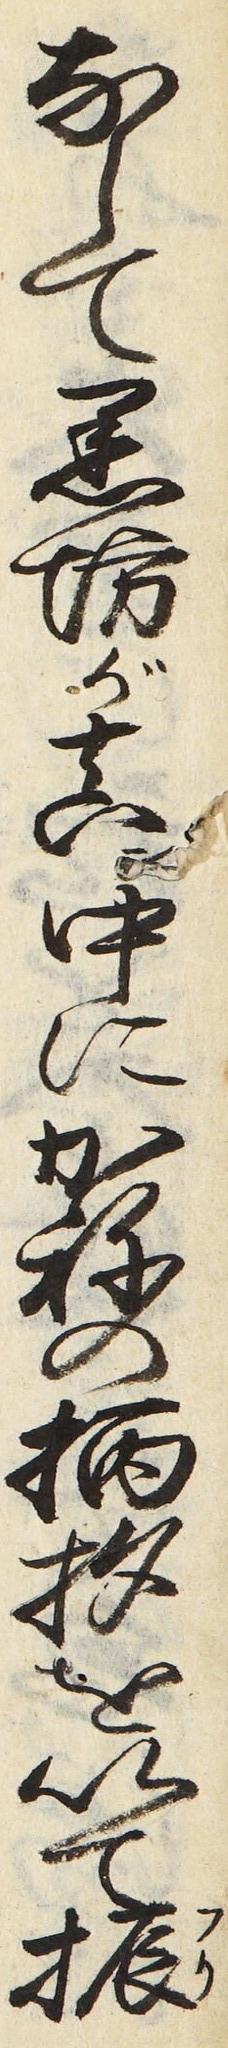なして黒坊が真ん中にかねの柄杓を以て振
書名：華夷九年録
